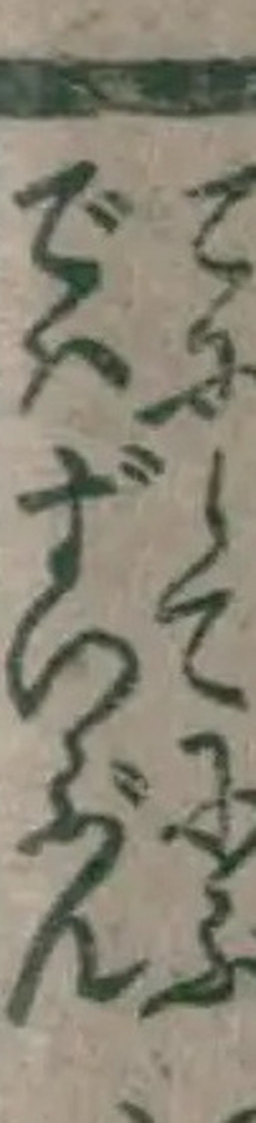ではずいぶん
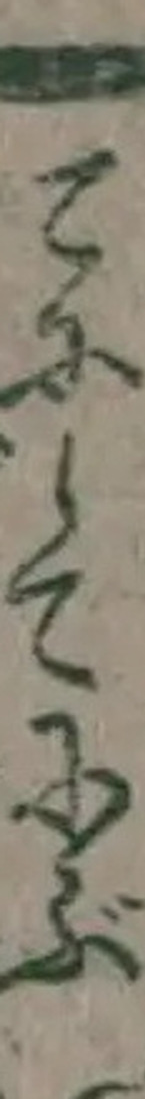てにしてにぶ
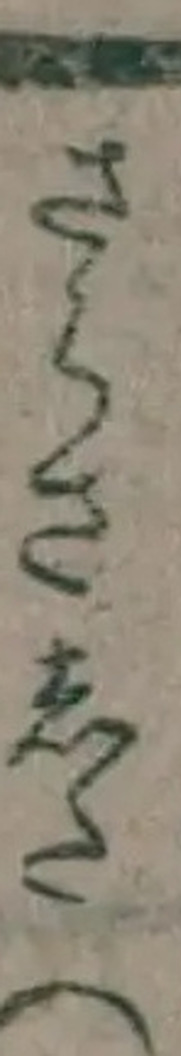さらさした
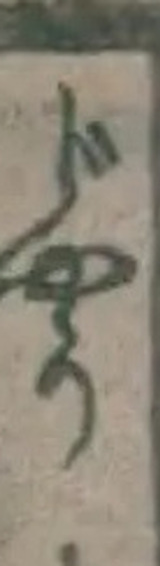じやう
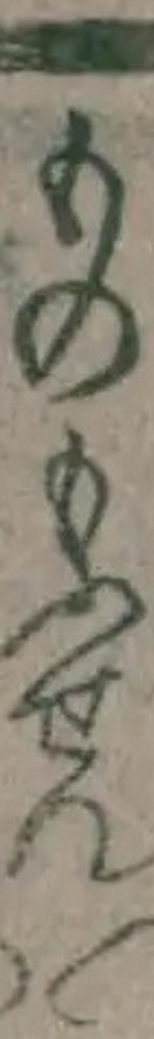ものもふせん
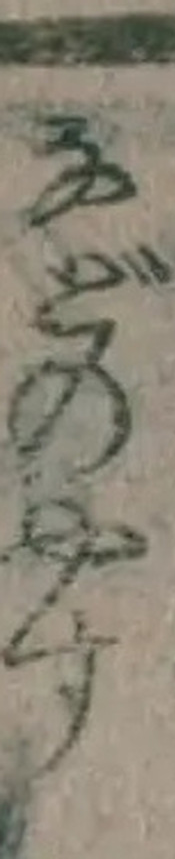などのやす
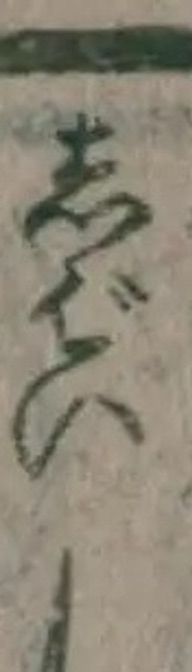しばい
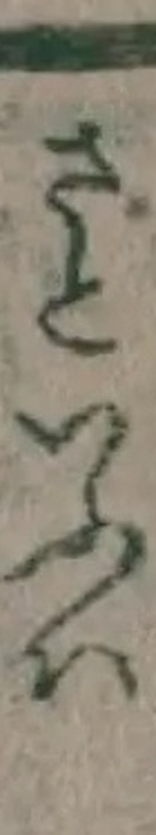さといふは
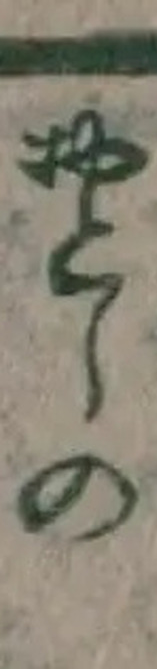おとしの
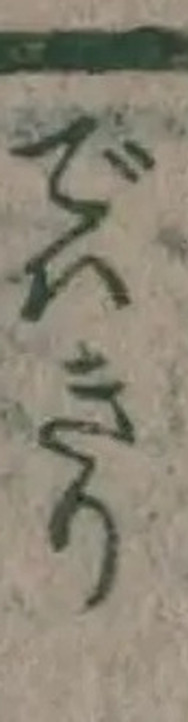ではきり
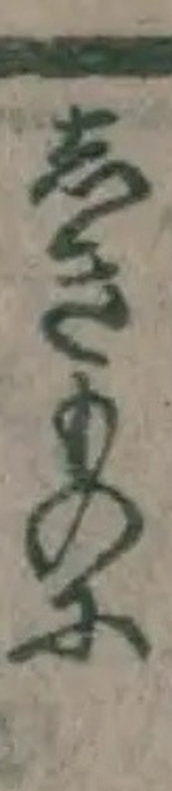しきものに
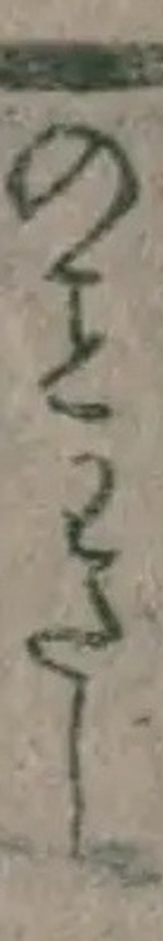のことわたし
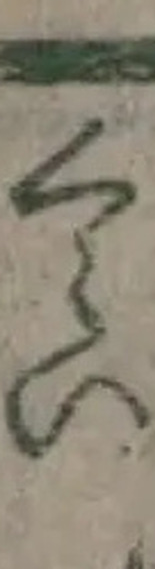くらい
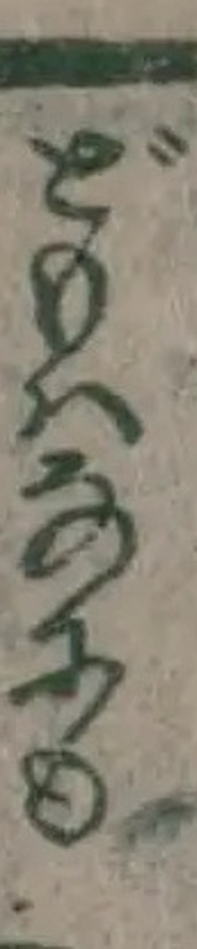どもはなにも
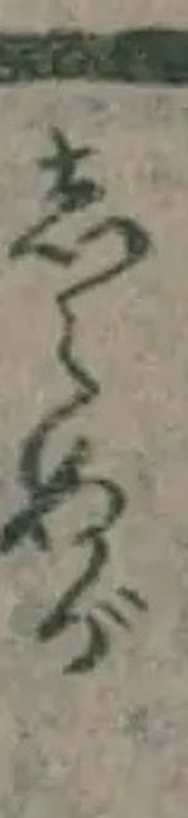しらぬが
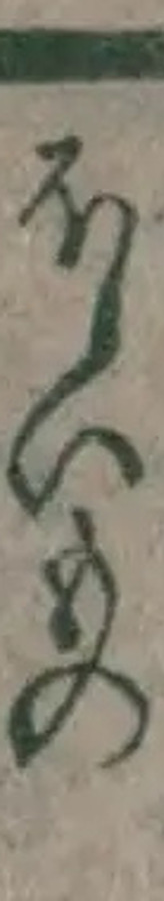ほしいもの
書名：縦筒放唐の噺 3巻
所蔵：国立国会図書館 National Diet Library, JAPAN
